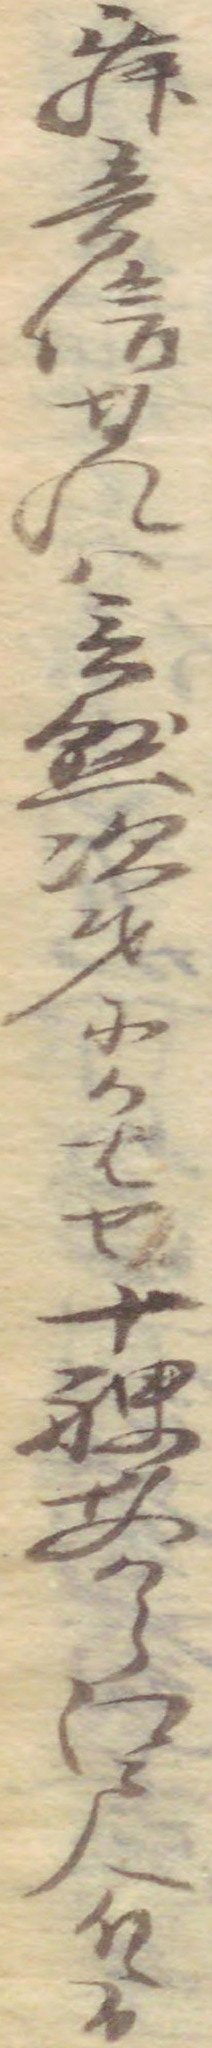舞音信なれは言懸次第にかはせ十艘なから江戸へ付たる

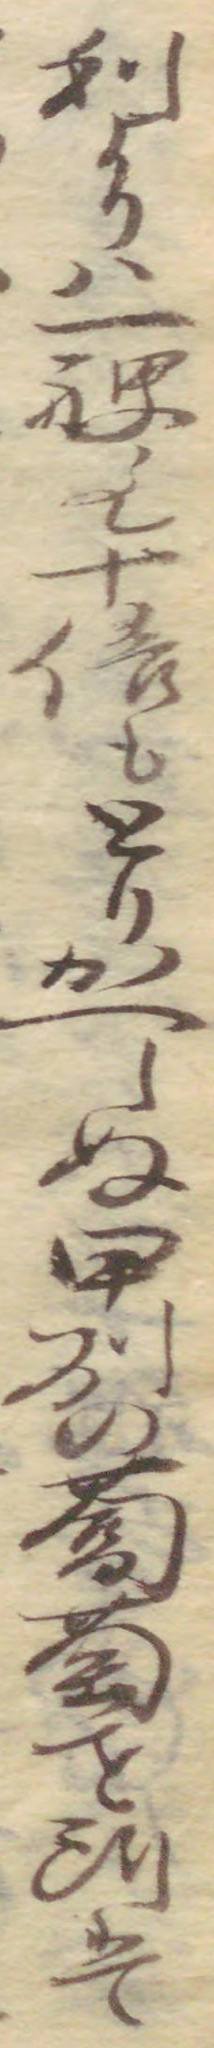利よりは一艘ニて十倍もとりかへしぬ甲州の葡萄を所にて
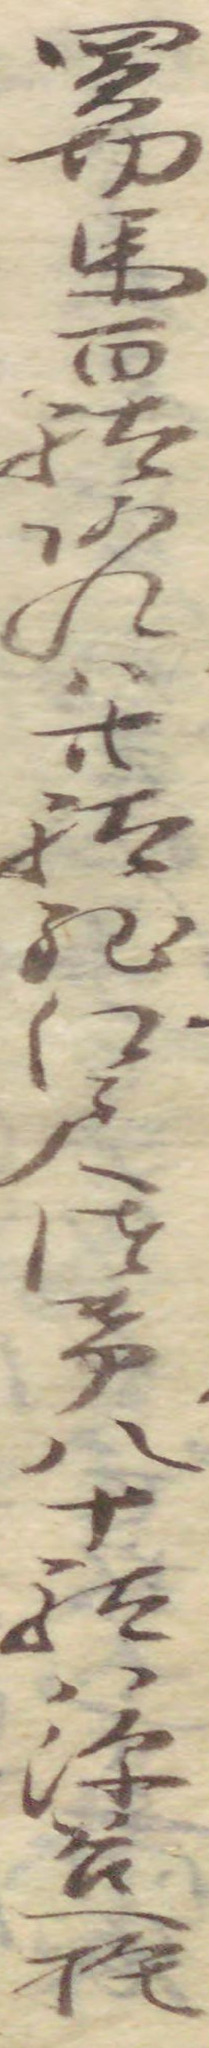買切馬百駄あれは廿駄程江戸へつけ八十駄は深谷へすて
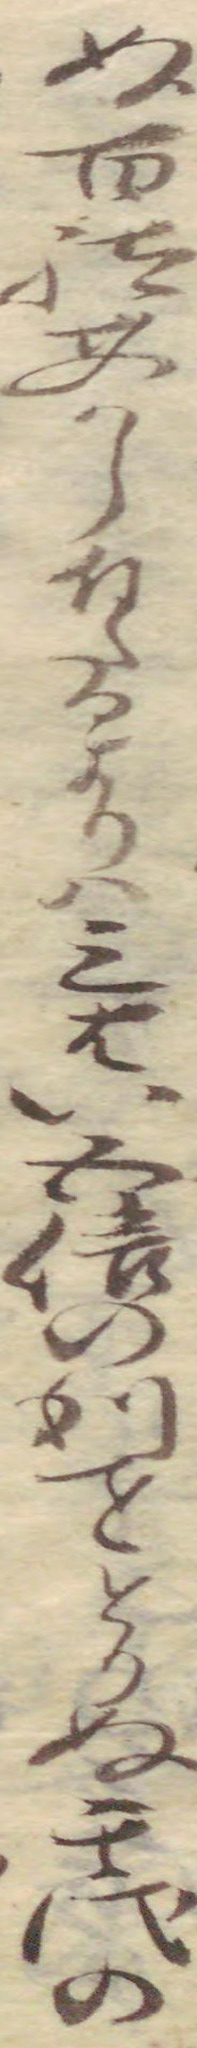ぬ百駄なから付たるよりは三はい五倍の利をとりぬ其代の
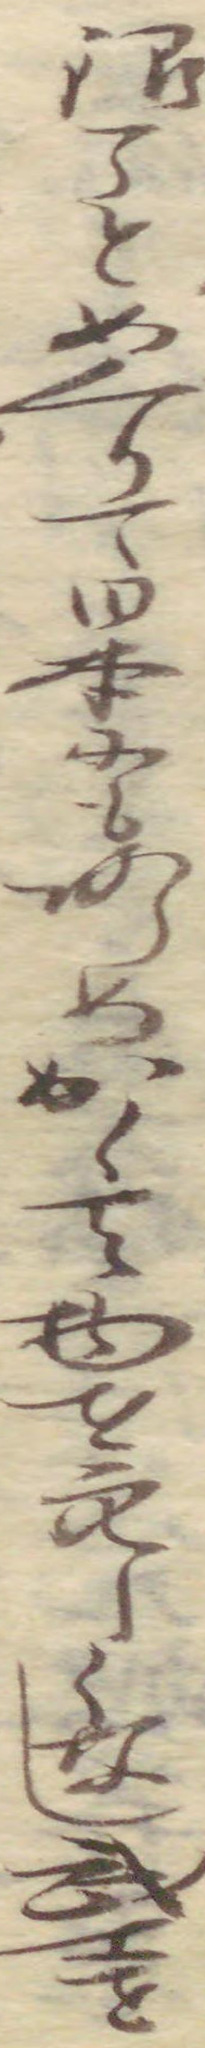銀こそめくりて日本にもあらめかくて物を空しくなし武士を
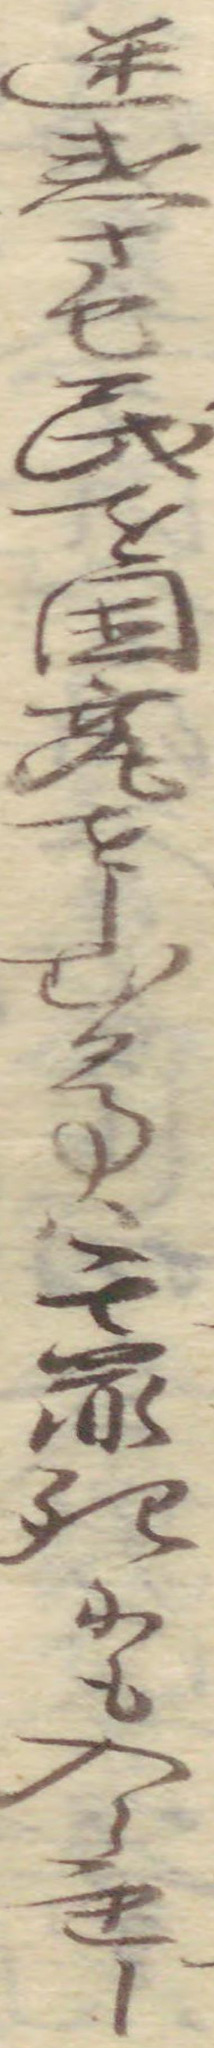迷惑させ民を困窮せしむる事は其罪死にも入られし
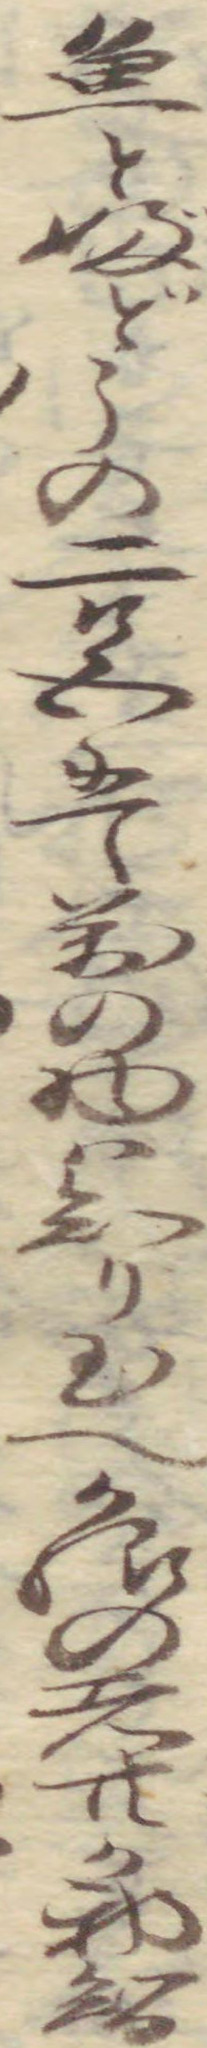魚とぶどうの二色にて万の物は知り玉へか様の者共か邪智
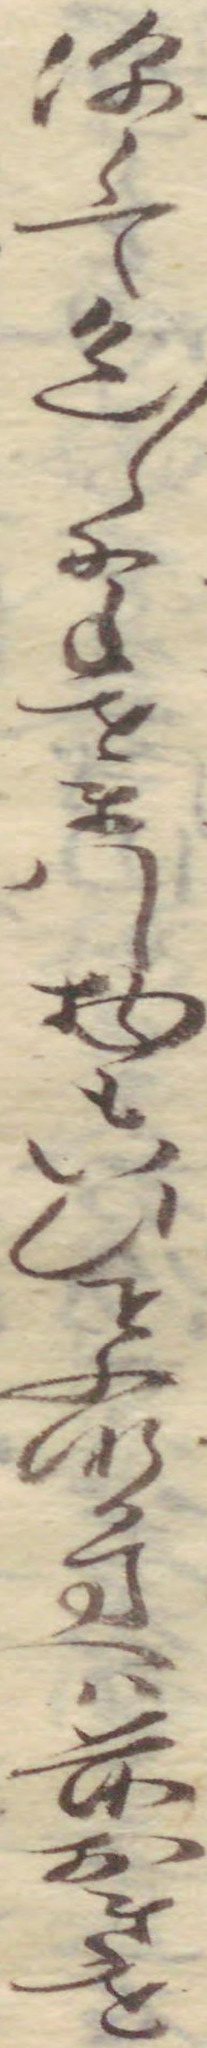深くて色〳〵に手をまわし物もいひそふなる方へは前おきを
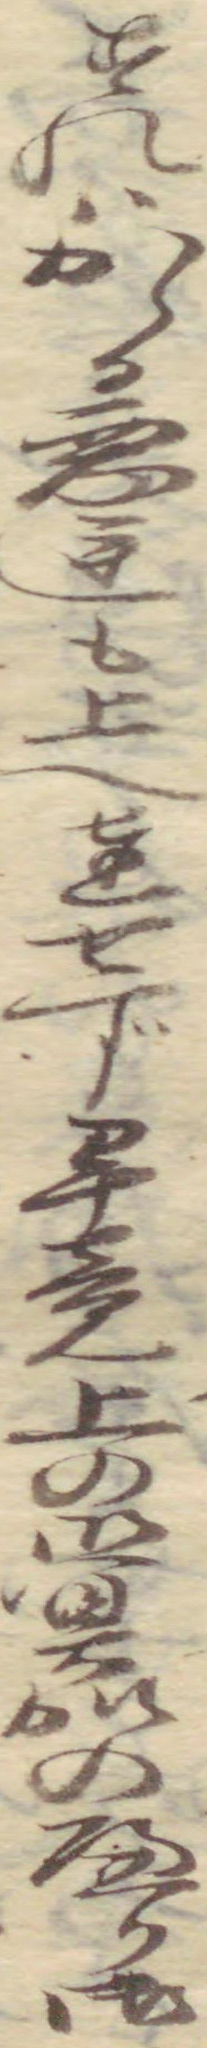すれはかゝる悪逆も上へ達せず畢竟上の御冥加のへり御
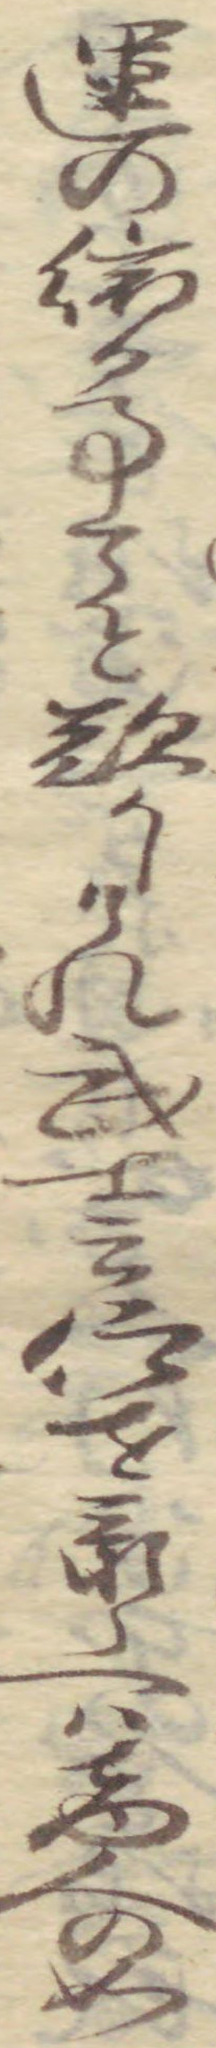運の縮る事こそ歎かしけれ武士云仰を承候へは商人の如
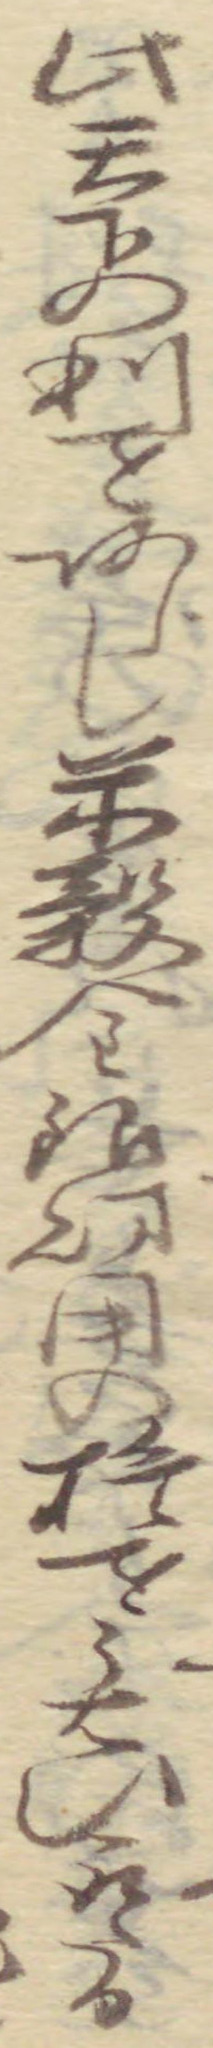此天下の利をあらし米穀金銀財用の権をうはひ取たる
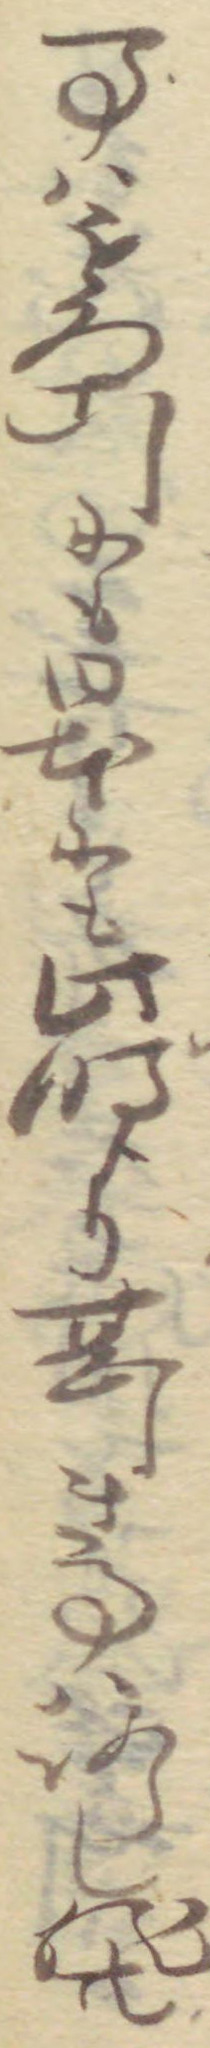事はもろこしにも日本にも此時より甚しき事はあらし然共
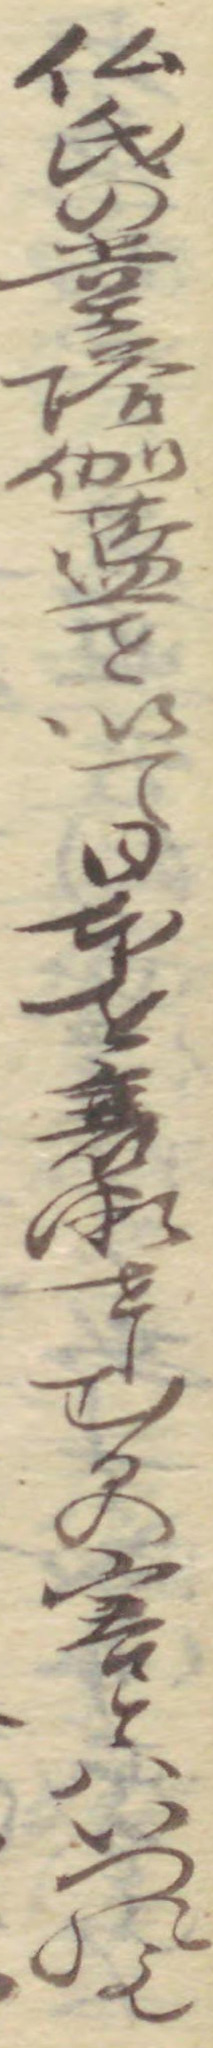仏氏の堂塔伽藍を以て日本を衰微せしむるの害とはいつれニて
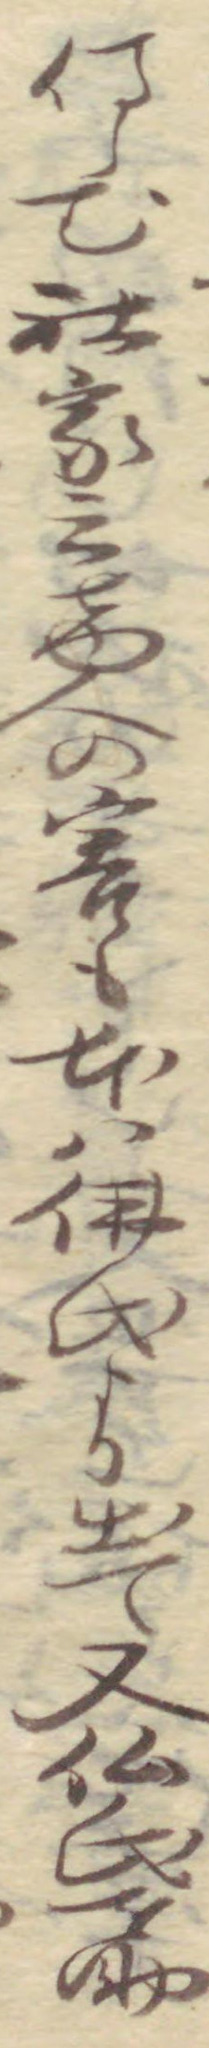侍らん社家云商人の害も本は仏氏より出て又仏氏を助
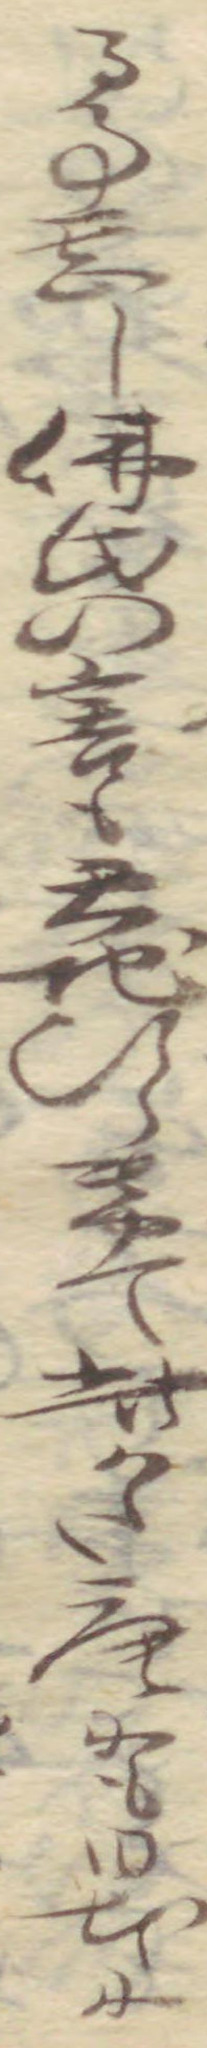る事甚し仏氏の害も天地ひらけて此かた唐にも日本に
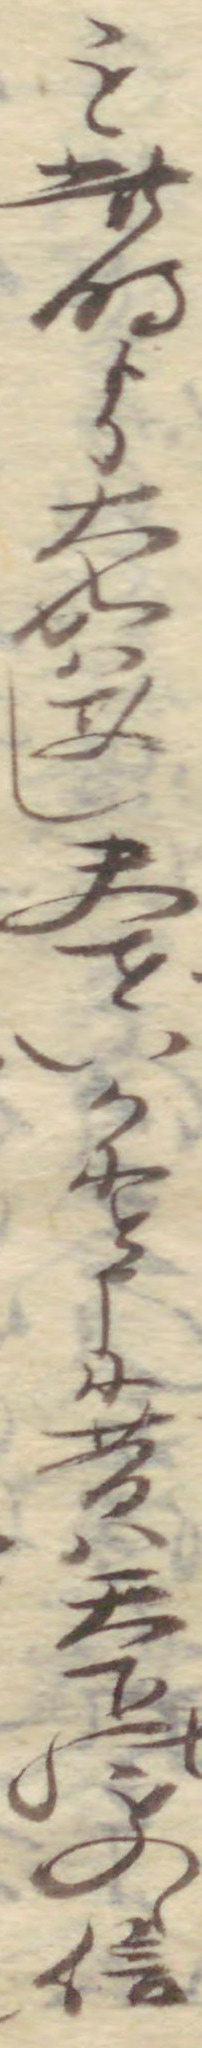も此時より大成はなし夫をいかにと申に昔は天下のものゝ信
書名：鶯宿雑記. 巻263-264
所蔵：国立国会図書館 National Diet Library, JAPAN
